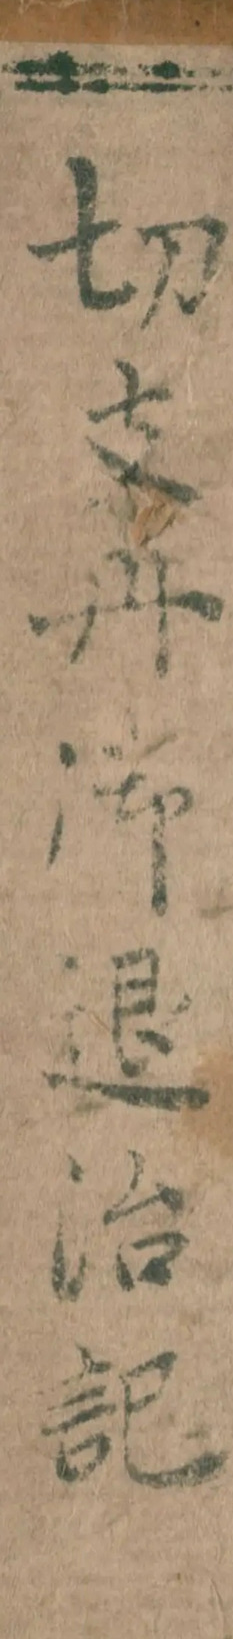切支丹御退治記一

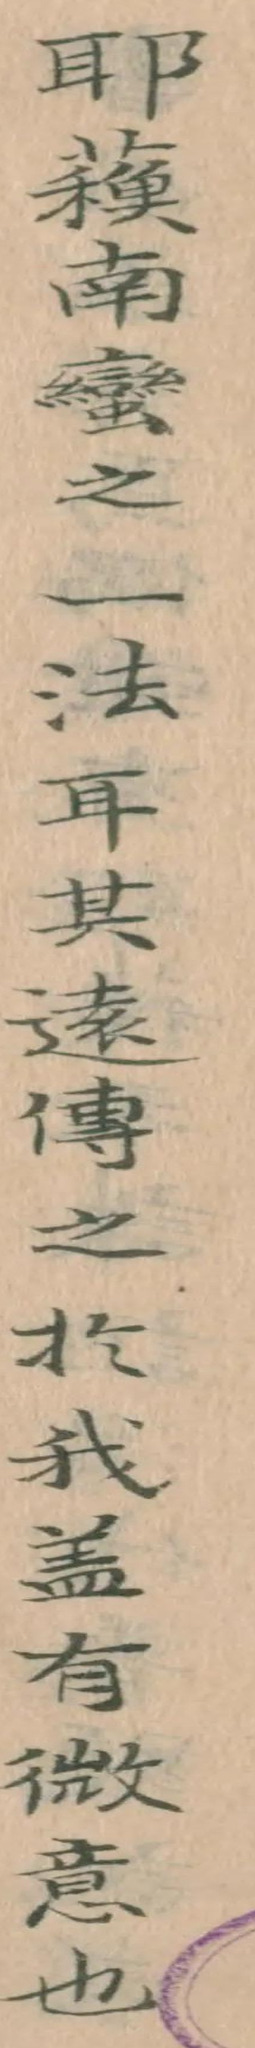耶蘇南蛮之一法耳其遠伝之於我蓋有微意也
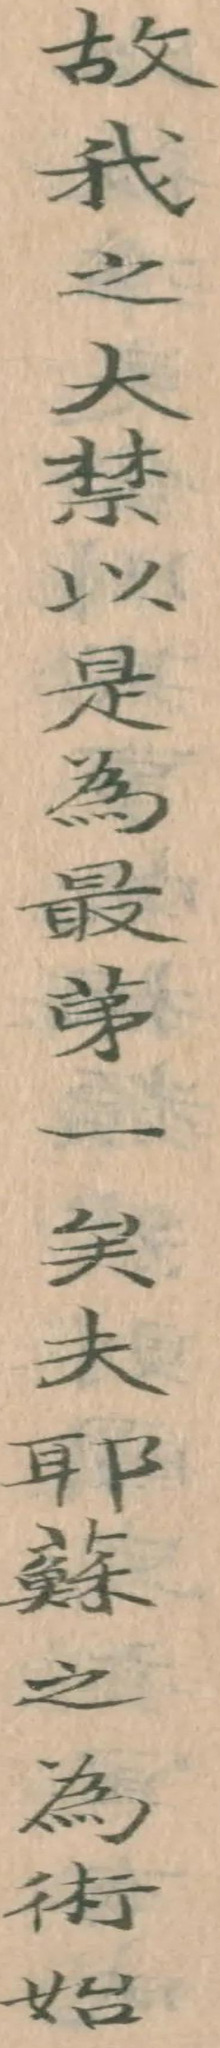故我之大禁以是為最第一矣夫耶蘇之為術始
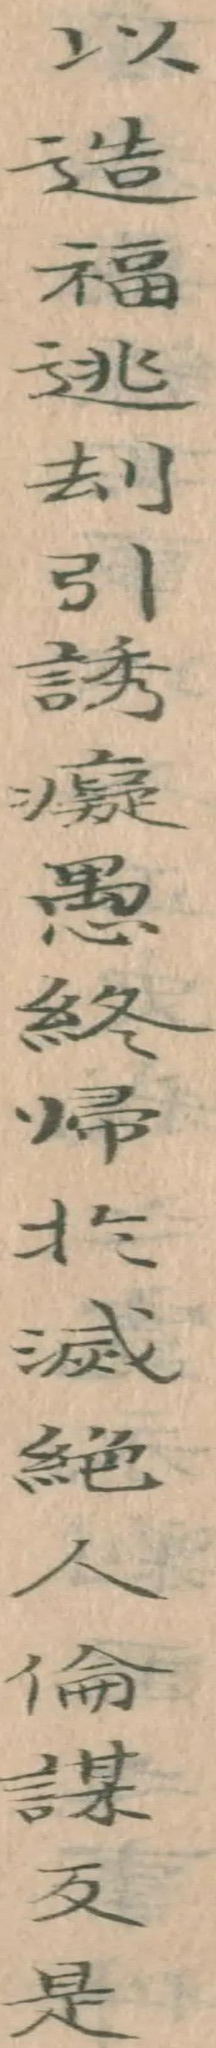以造福逃劫引誘癡愚終帰於滅絶人倫謀反是
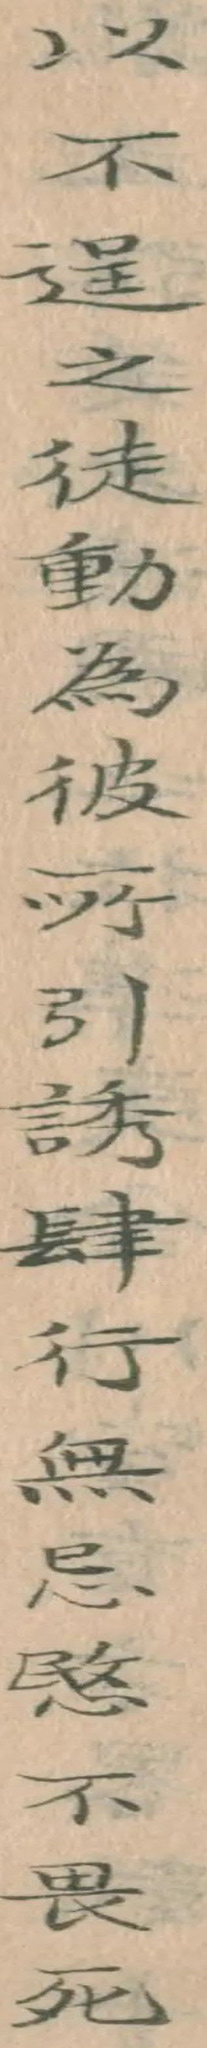以不逞之徒動為彼所引誘肆行無忌愍不畏死
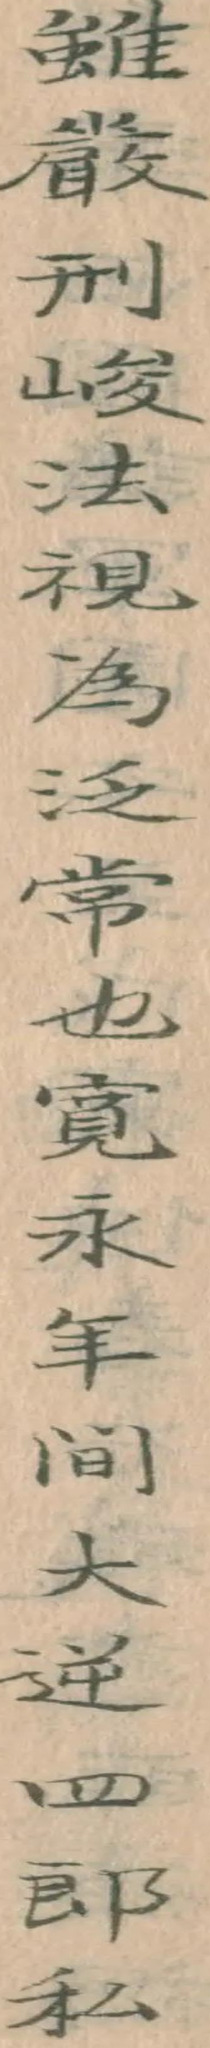雖厳刑峻法視為泛常也寛永年間大逆四郎私
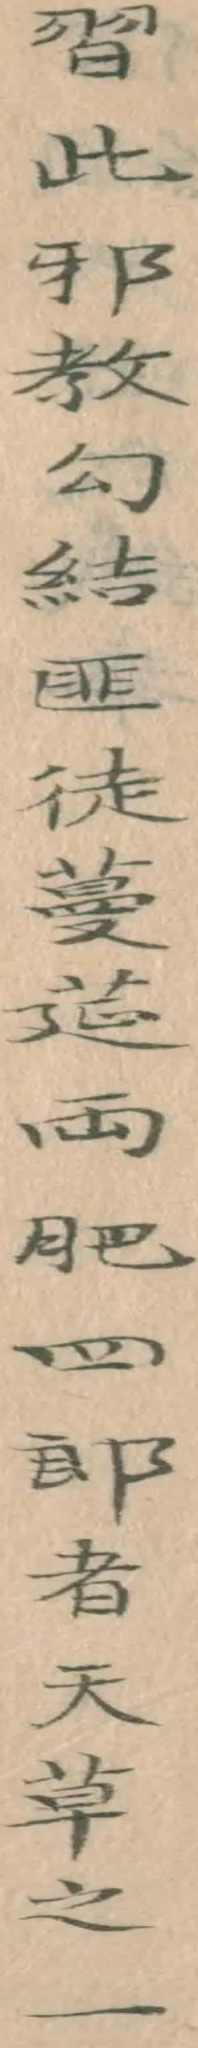習此邪教勾結匪徒蔓莚両肥四郎者天草之一
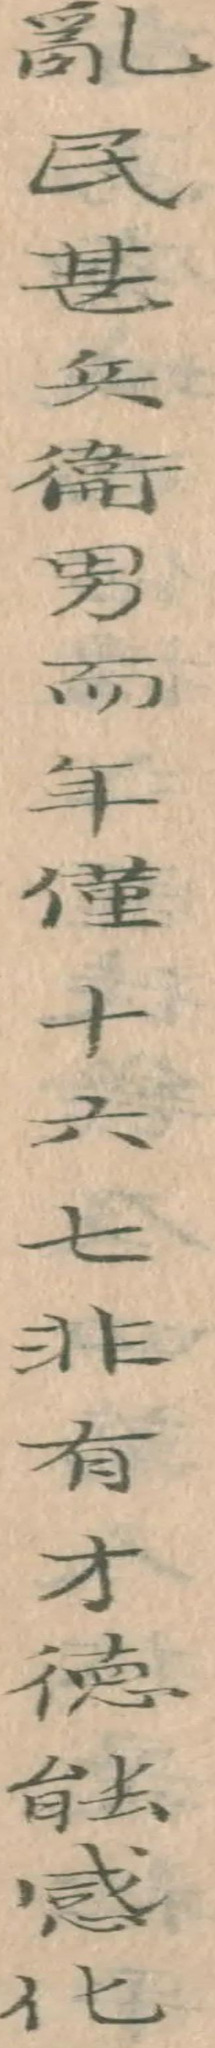乱民甚兵衛男而年僅十六七非有才徳能感化
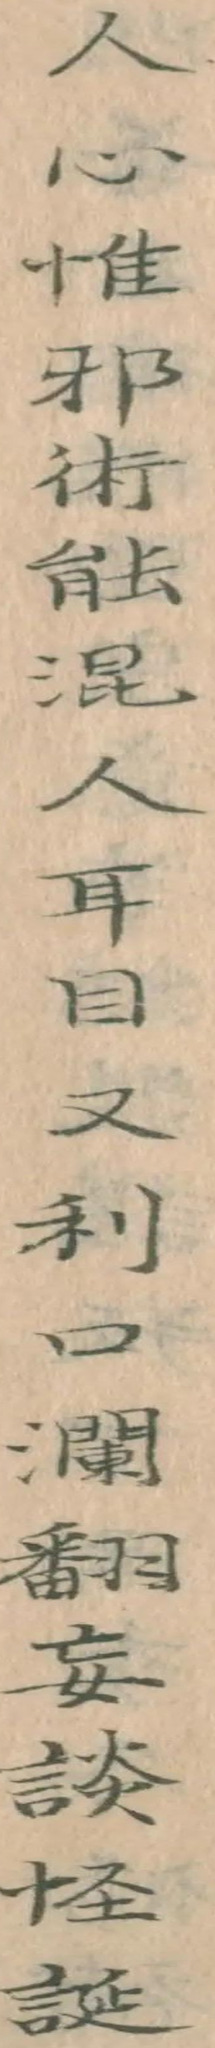人心惟邪術能混人耳目又利口瀾翻妄談怪誕
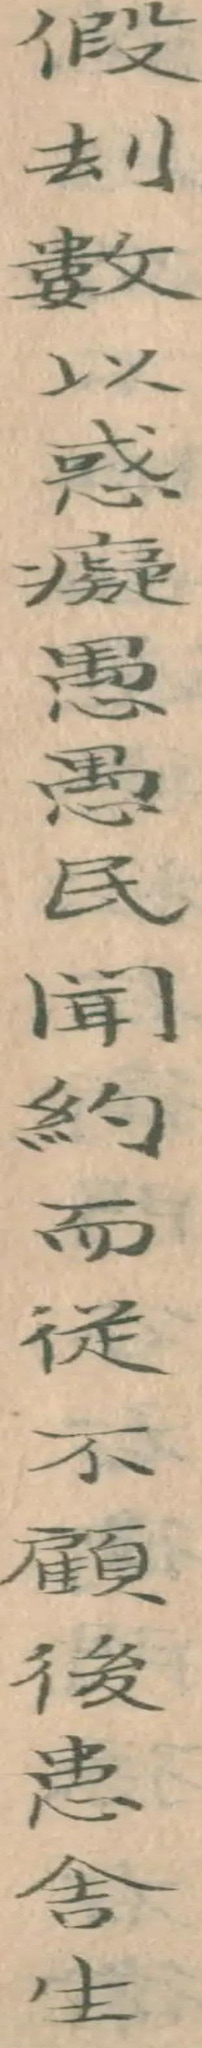仮劫数以惑癡愚愚民聞約而従不顧後患舎生

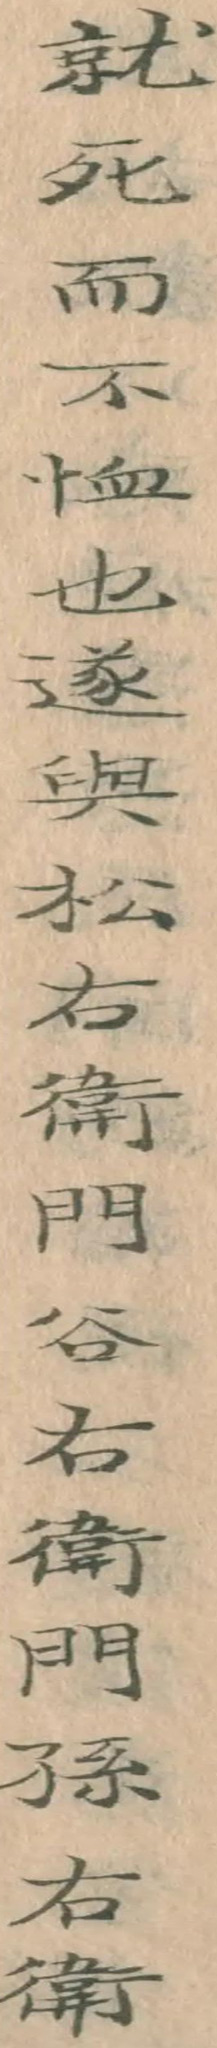就死而不恤也遂与松右衛門谷右衛門孫右衛
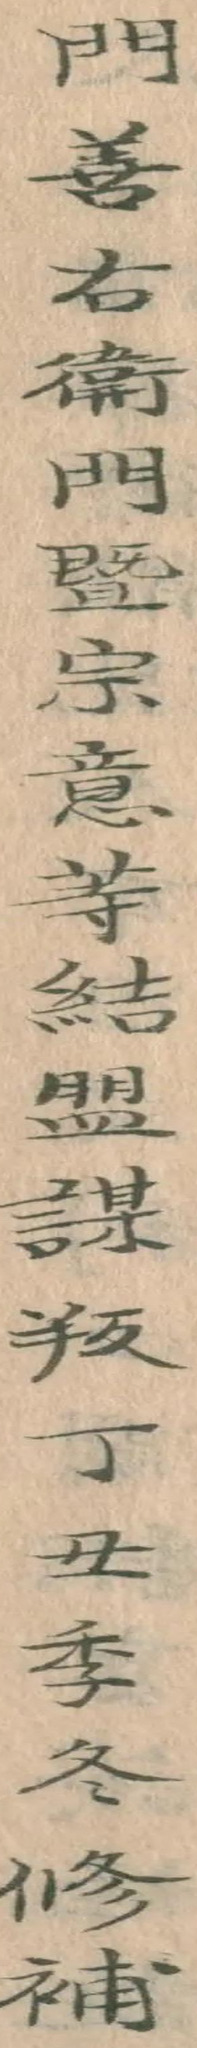門善右衛門曁宗意等結盟謀叛丁丑季冬修補
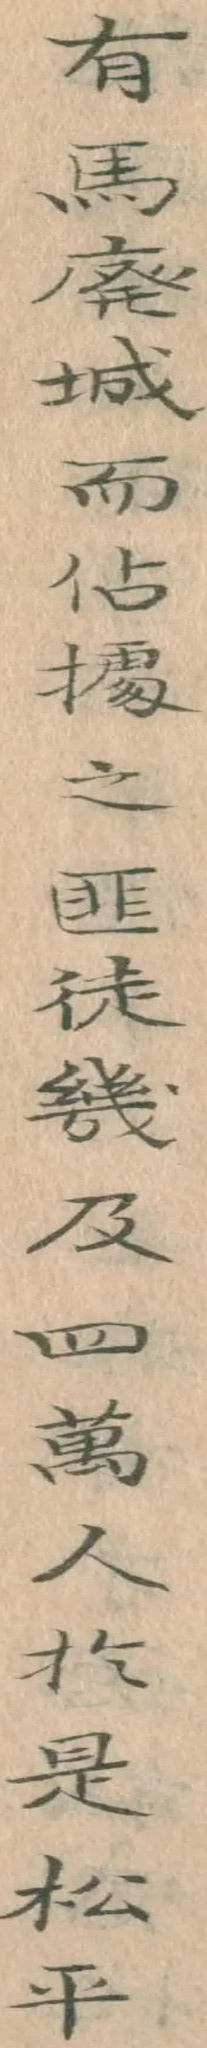有馬廃城而佔拠之匪徒幾及四万人於是松平
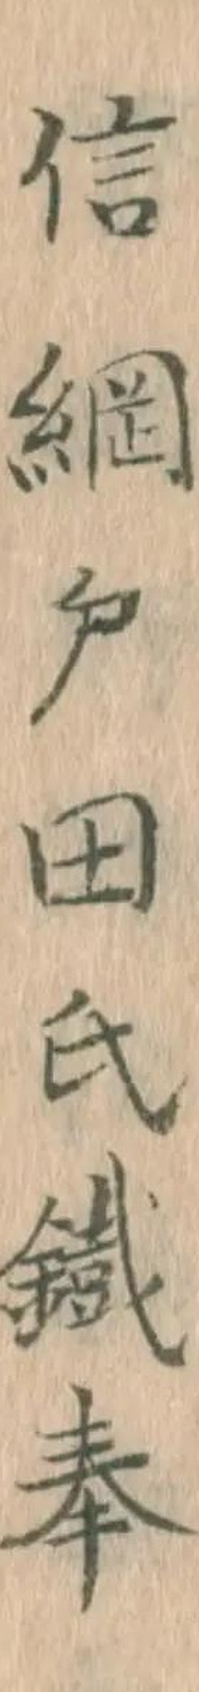信綱戸田氏鉄奉
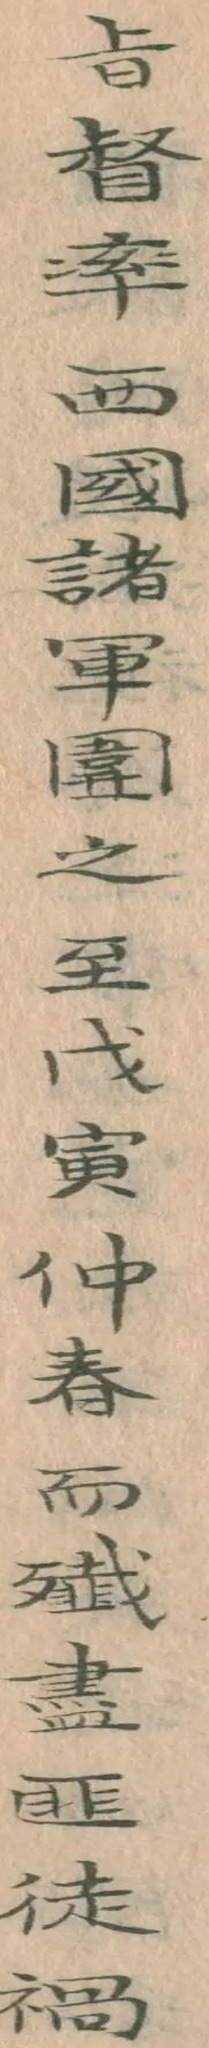旨督率西国諸軍囲之至戊寅仲春而殲尽匪徒禍
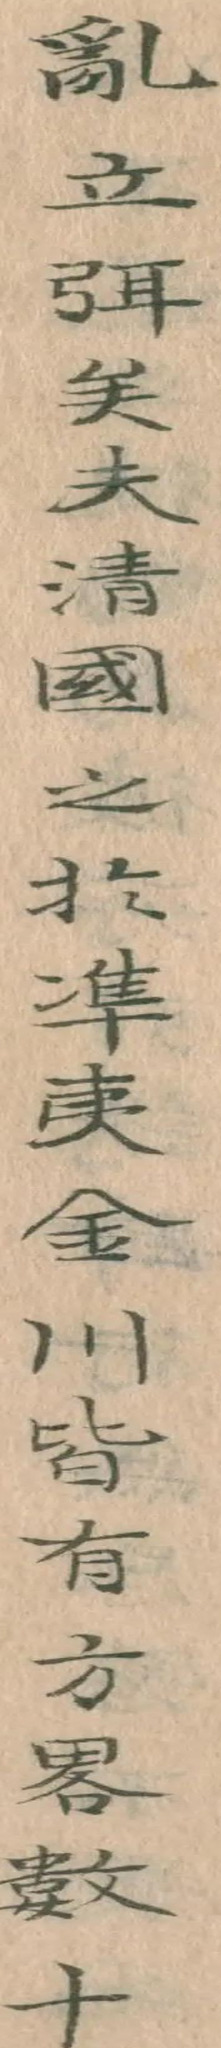乱立弭矣夫清国之於準夷金川皆有方略数十
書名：切支丹御退治記 49巻. [1]
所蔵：国立国会図書館 National Diet Library, JAPAN
